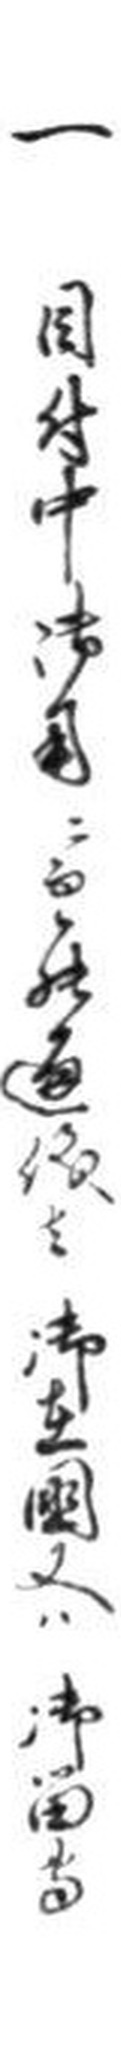一目付中御用ニ而罷通儀者御在国又ハ御留守
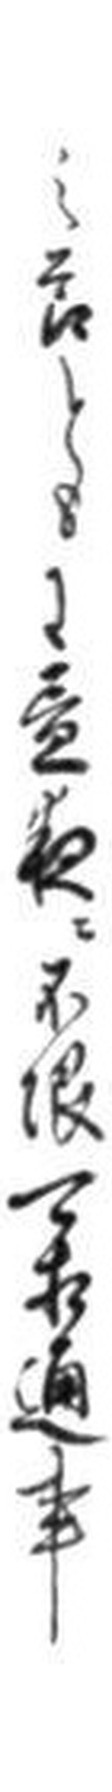之節ともに昼夜ニ不限可相通事
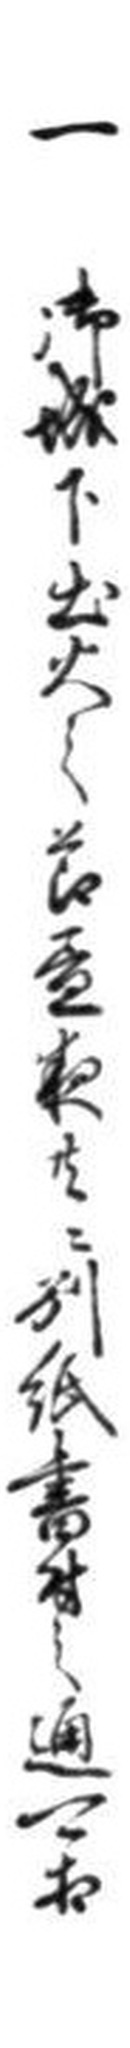一御城下出火之節昼夜共ニ別紙書付之通可相
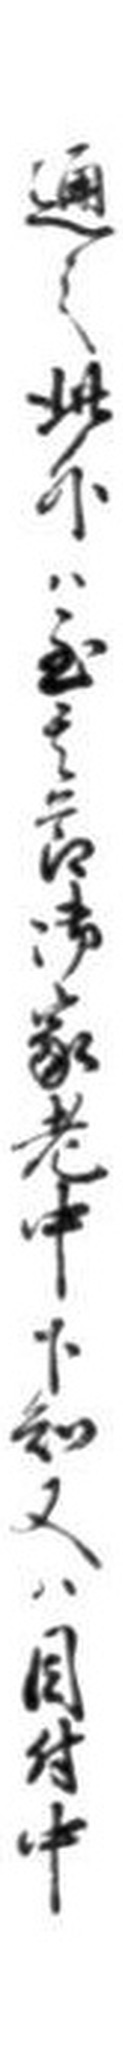通之此外ハ至其節御家老中下知又ハ目付中
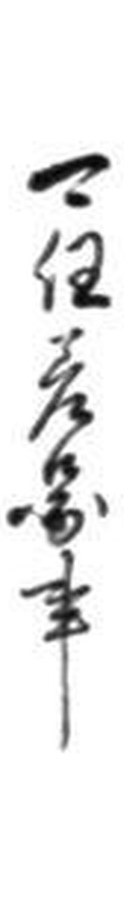可任差図事
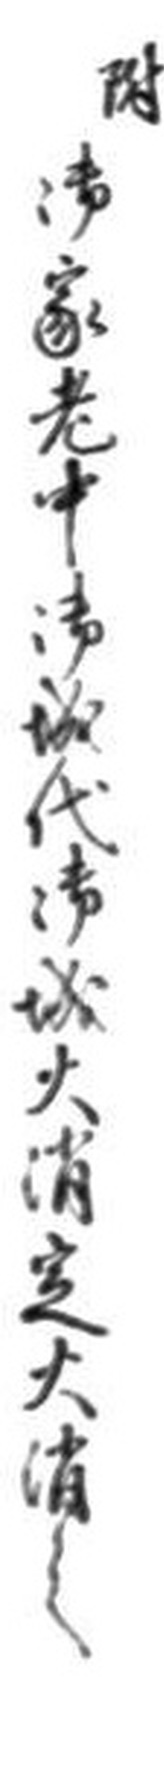御家老中御城代御城火消定火消之
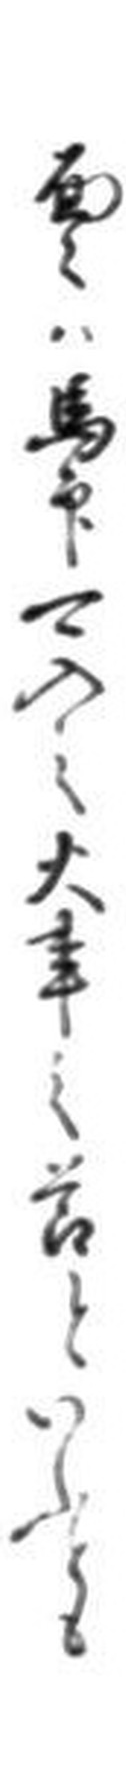面々ハ馬印可入之火事之節といふとも
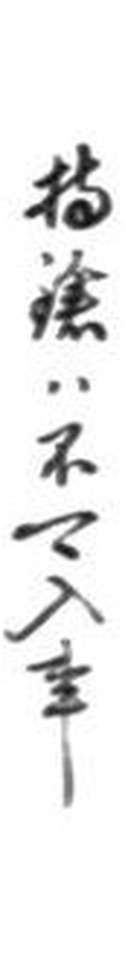持鎗ハ不可入事
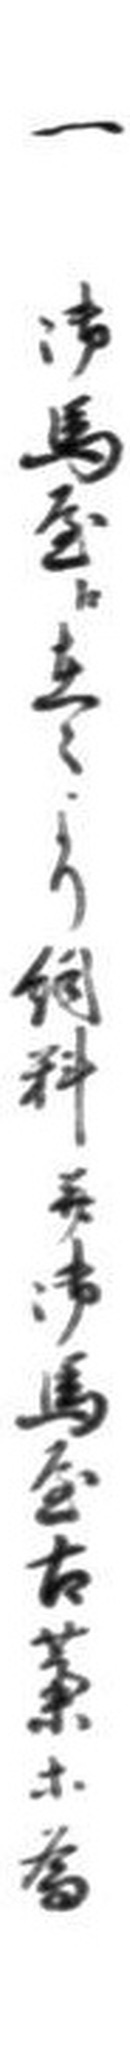一御馬屋江在々より飼料并御馬屋古稾等為
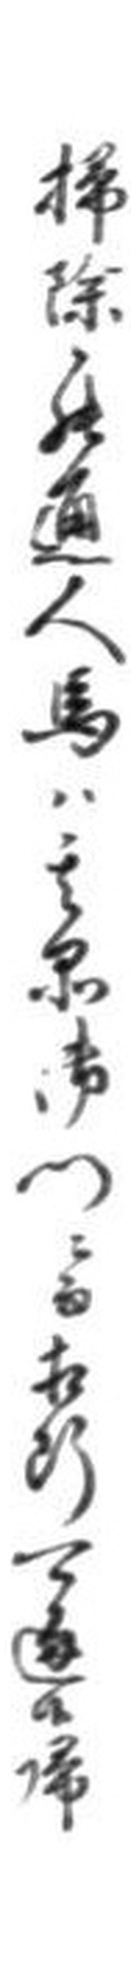掃除罷通人馬ハ其品御門ニ而相断可通候帰
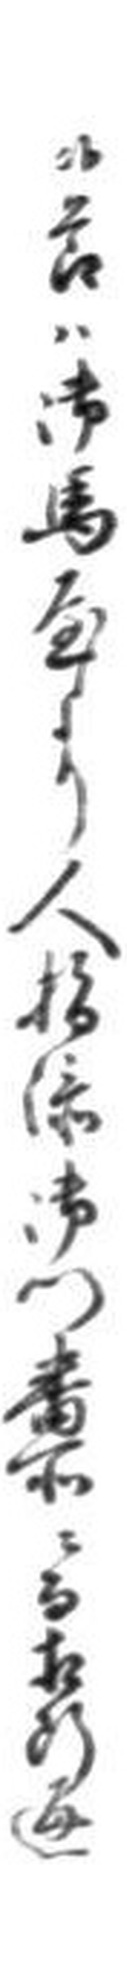候節ハ御馬屋より人指添御門番所ニ而相断通
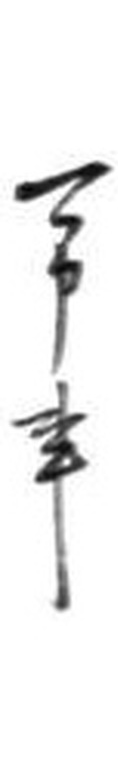可申事
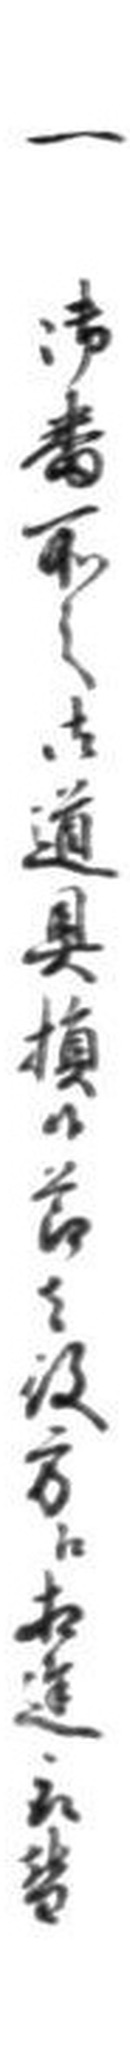一御番所之御道具損候節者役方江相達取替
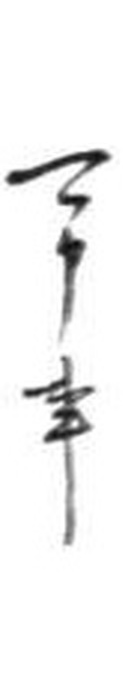可申事

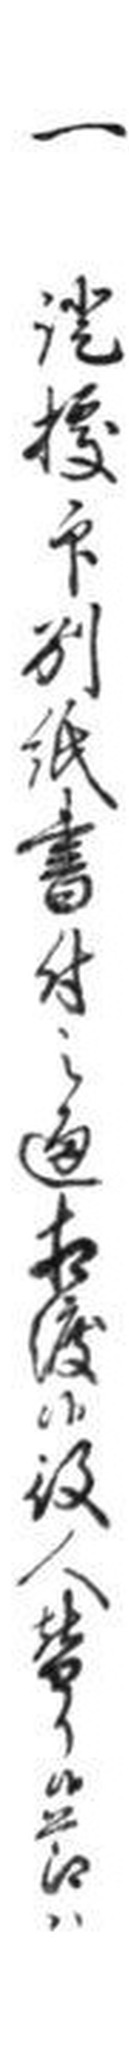一証拠印別紙書付之通相渡候役人替り候節ハ
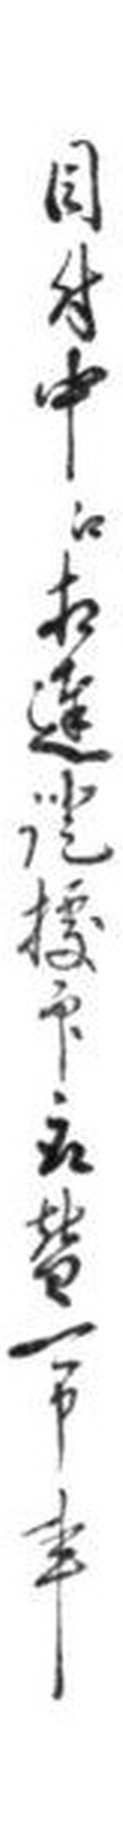目付中江相達証拠印取替可申事
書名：家譜 三十三 吉邦公 享保四年
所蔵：福井県文書館 Fukui Prefectural Archives
